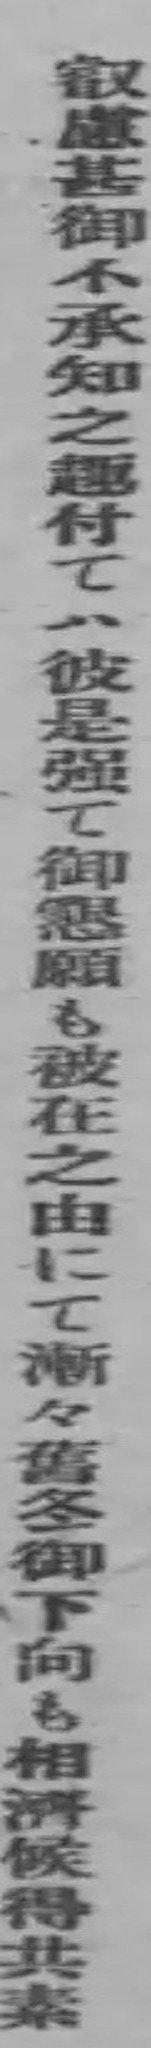叡慮甚御不承知之趣付てハ彼是強て御懇願も被在之由にて漸々旧冬御下向も相済候得共素
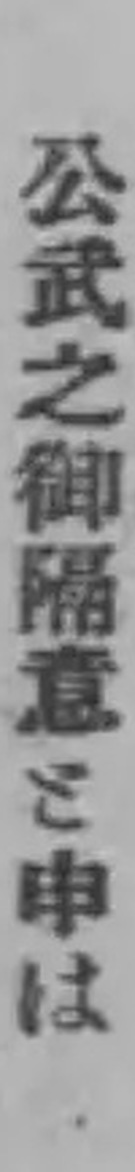公武之御隔意と申は
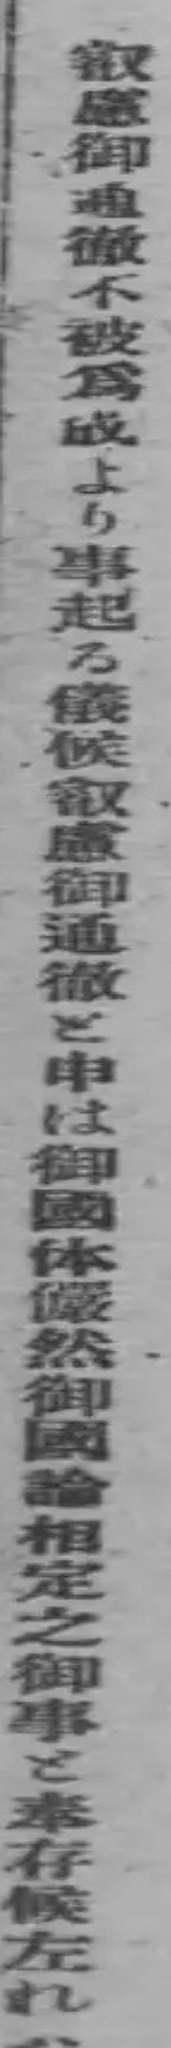叡慮御通徹不被為成より事起る儀候叡慮御通徹と申は御国体儼然御国論相定之御事と奉存候左れハ

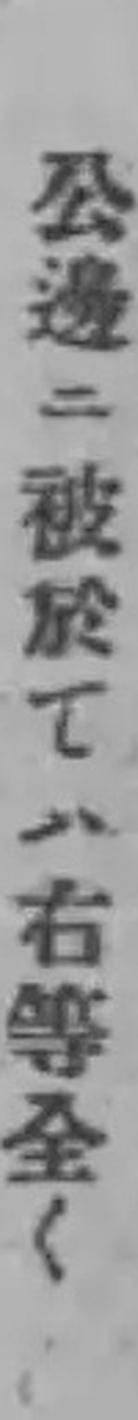公辺ニ被於ては右等全く
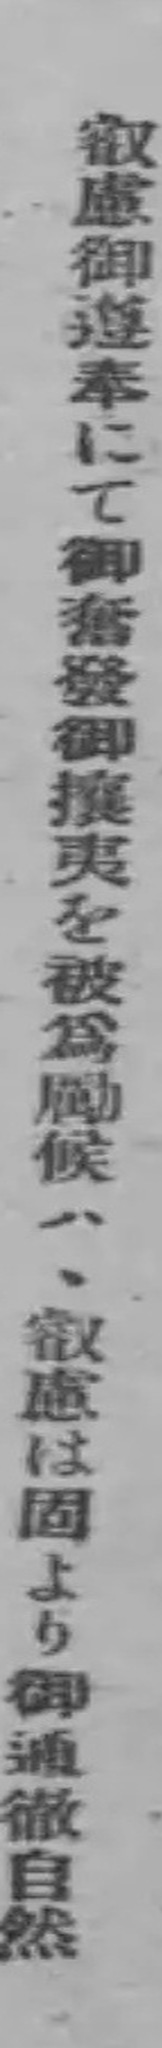叡慮御遵奉にて御奮発御攘夷を被為励候はヽ叡慮は固より御通徹自然
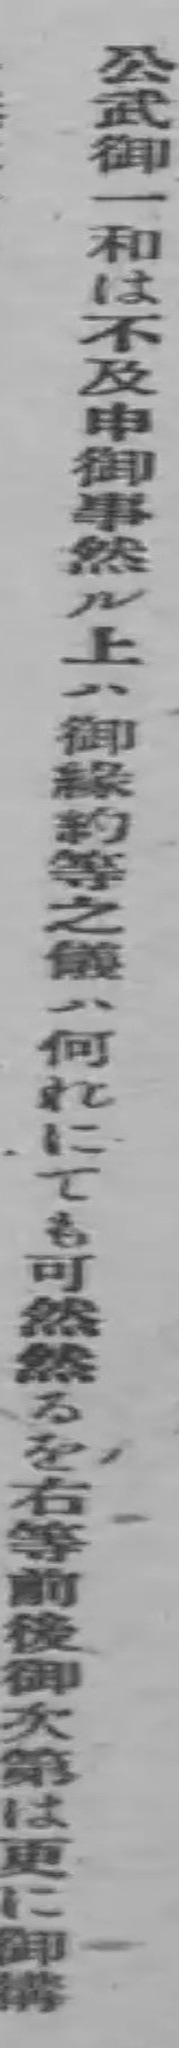公武御一和は不及申御事然ル上は御縁約等之儀は何れにても可然然るを右等前後御次第は更に御構
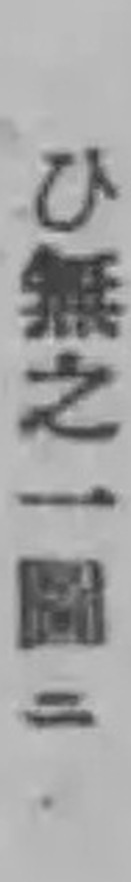ひ無之一図ニ
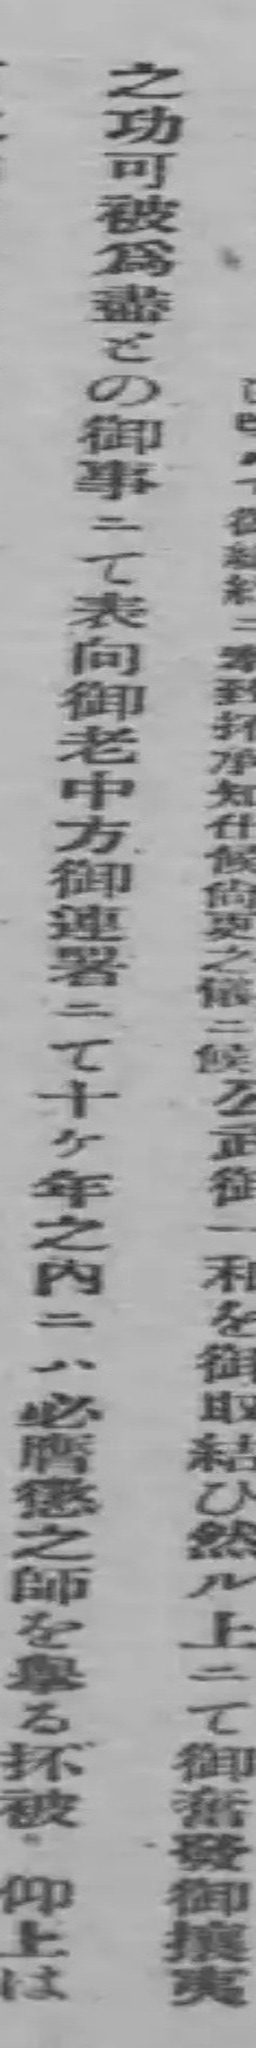之功可被為盡との御事ニて表向御老中方御連署ニて十ケ年之内ニは必暦懲之師を挙る抔被仰上は
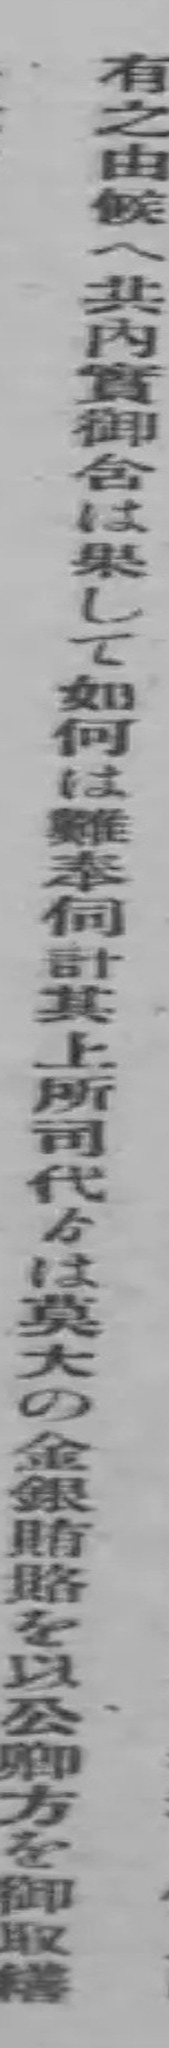有之由候へ共内実御含は果して如何は難奉伺計其上所司代ゟは莫大の金銀賄賂を以公卿方を御取繕
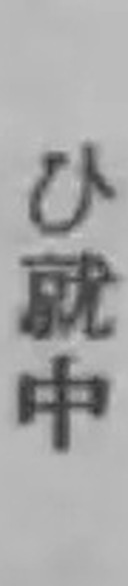ひ就中
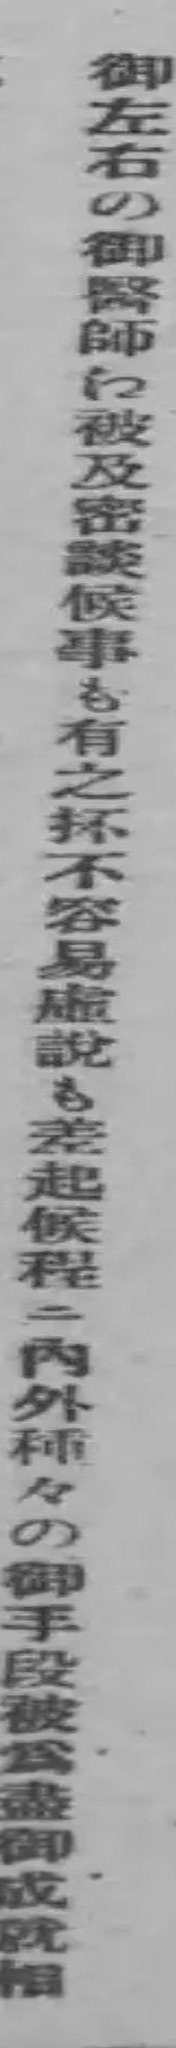御左右の御医師え被及密談候事も有之抔不容易虚説も差起候程ニ内外種々の御手段被為盡御成就相
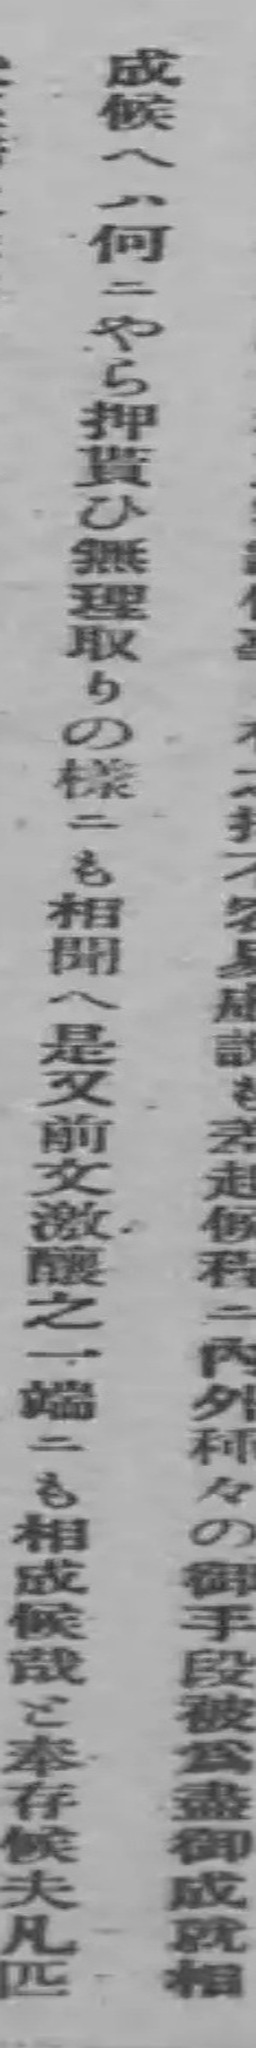成候へは何ニやら押貰ひ無理取りの様ニも相聞へ是又前文激醸之一端ニも相成候哉と奉存候夫凡匹
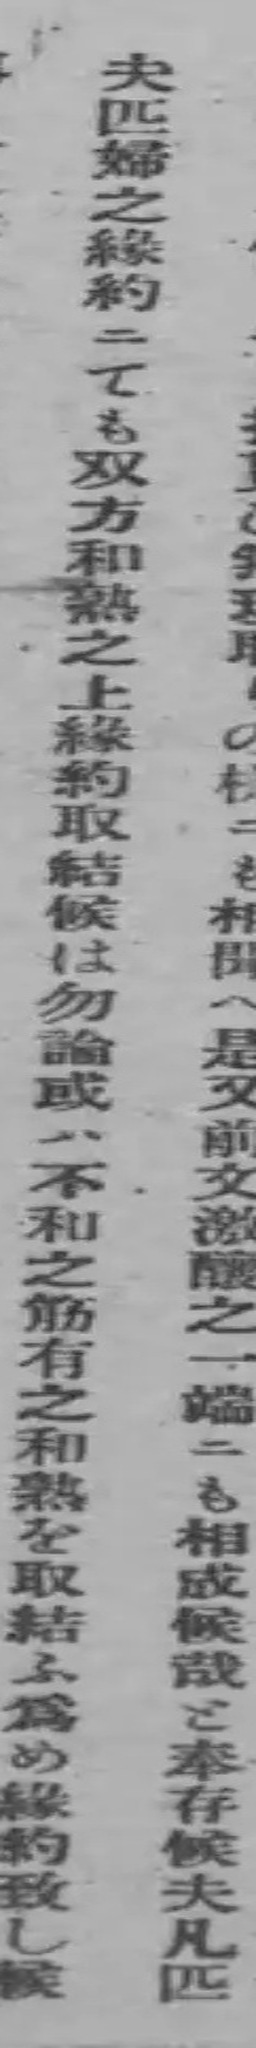夫匹婦之縁約ニても双方和熟之上縁約取結候は勿論或は不和之筋有之和熟を取結ふ為め縁約致し候
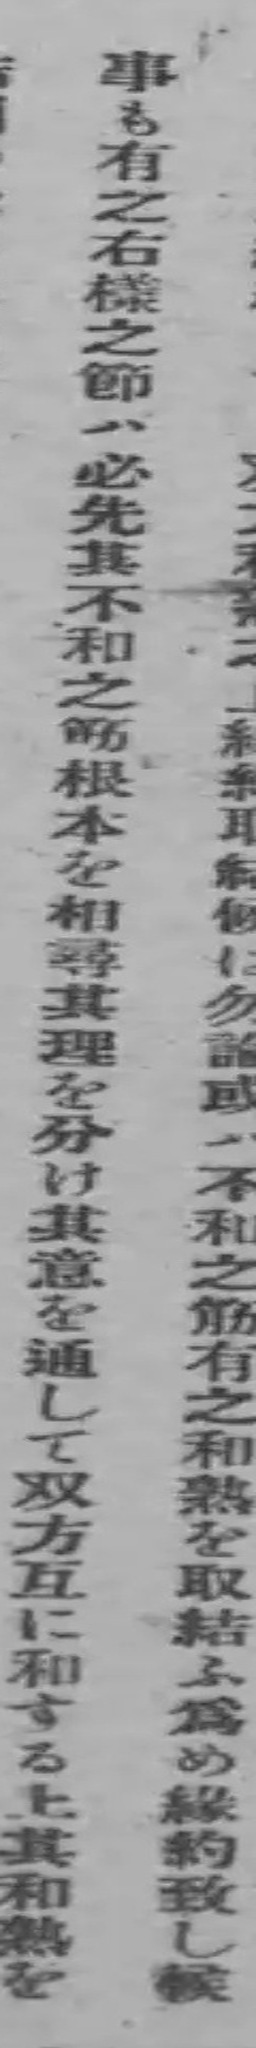事も有之右様の節は必先其不和之筋根本を相尋其理を分け其意を通して双方互に和する上其和熟を
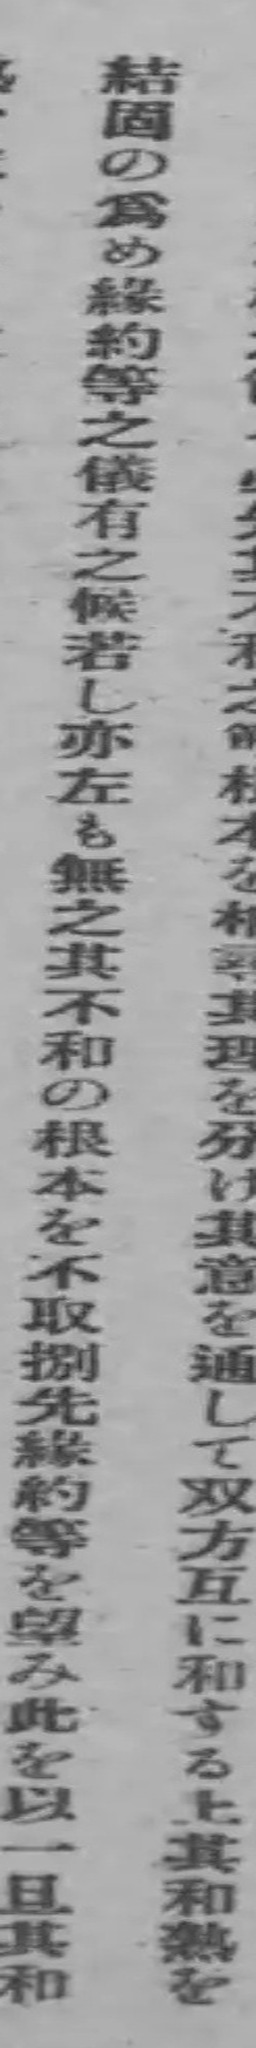結固の為め縁約等之儀有之候若し亦左も無之其不和の根本を不取捌先縁約等を望み此を以一旦其和
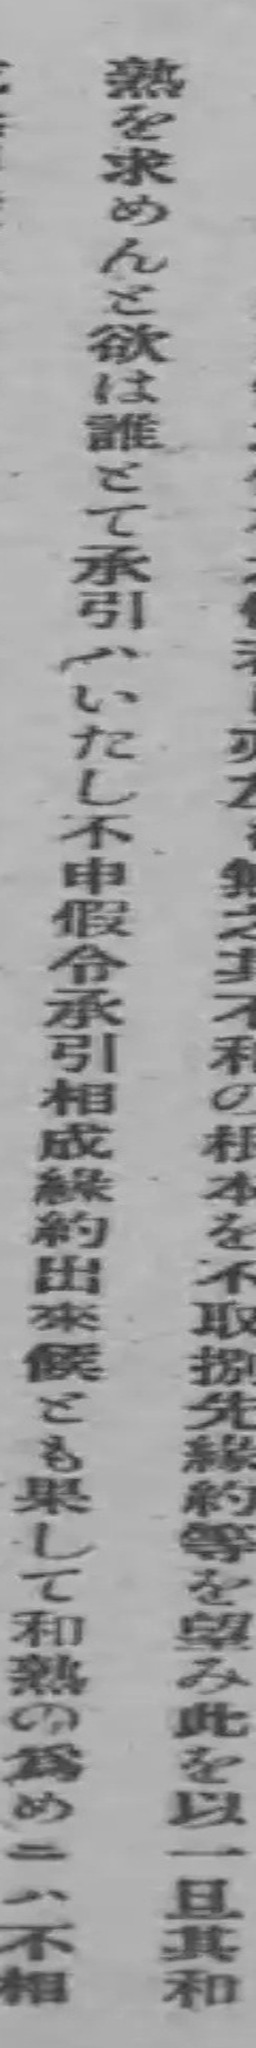熟を求めんと欲は誰とて承引はいたし不申仮令承引相成縁約出来候とも果して和熟の為めニは不相
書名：豊橋市史談
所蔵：国立国会図書館 National Diet Library, JAPAN
